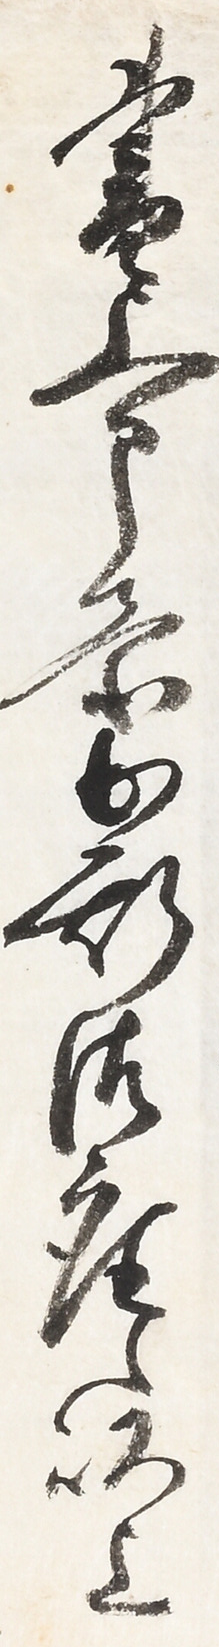書上申候所如斯御座候以上
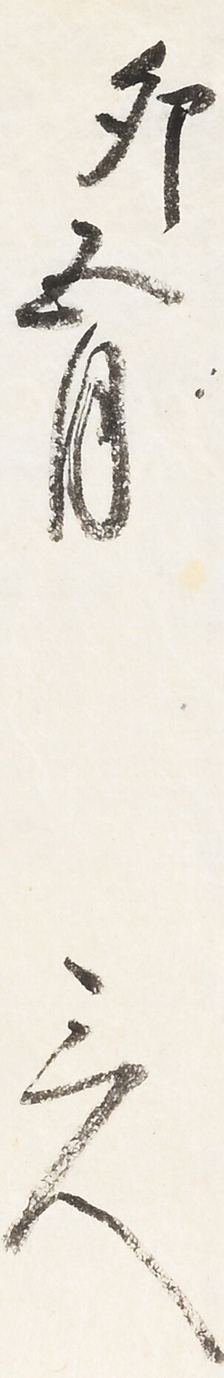卯五月三人
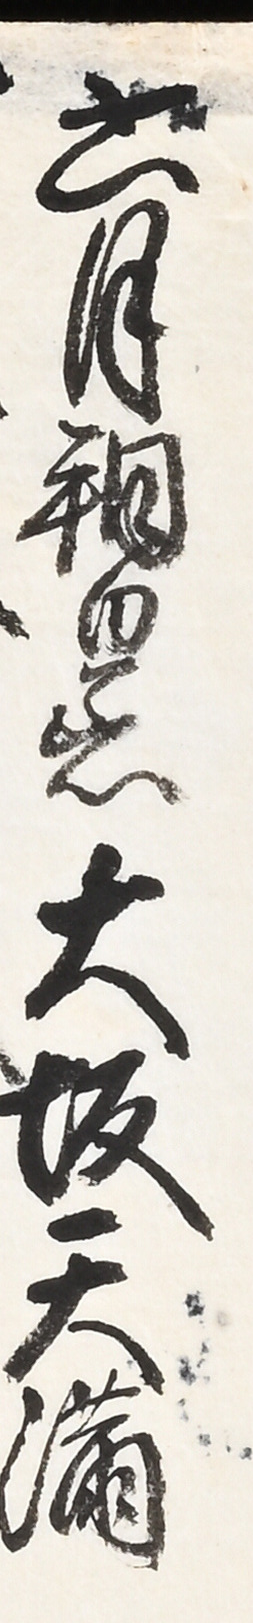六月朔日着大坂天満
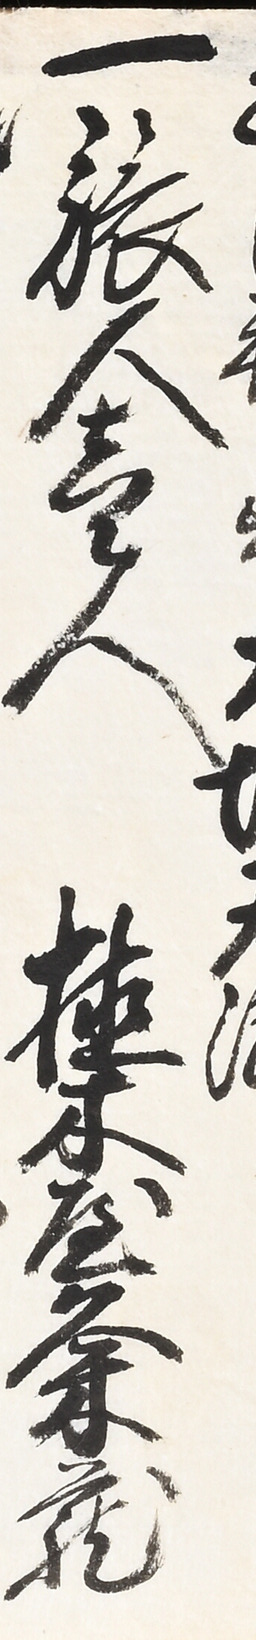一旅人壱人植木屋粂蔵
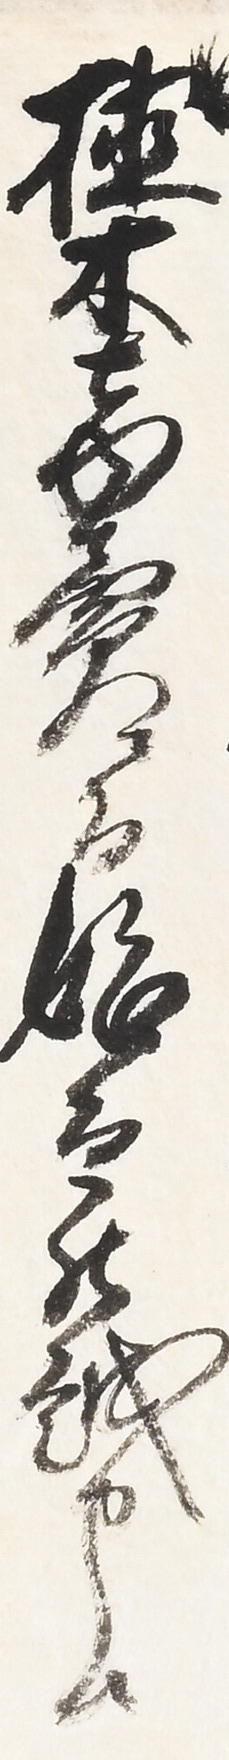植木商売ニ而始而罷越申候
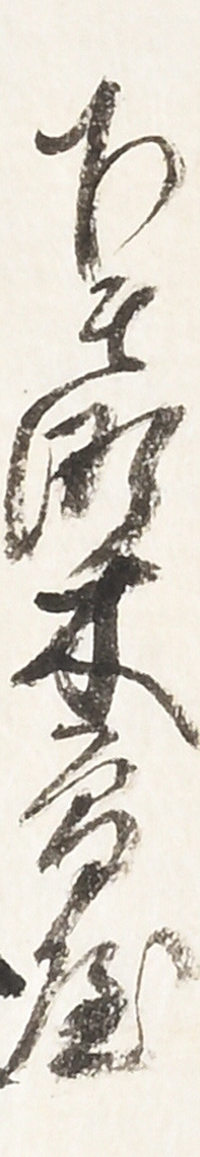下モ町木曽屋
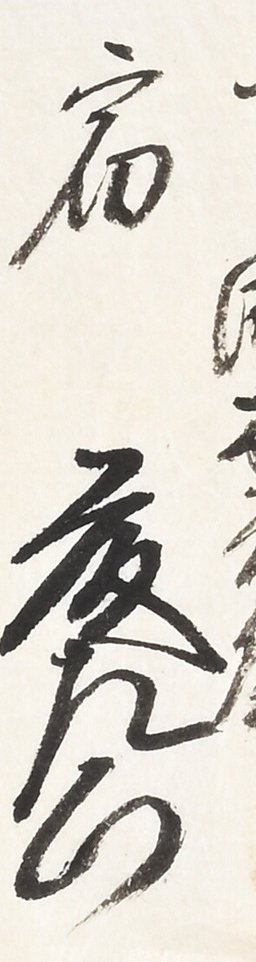宿籐左衛門
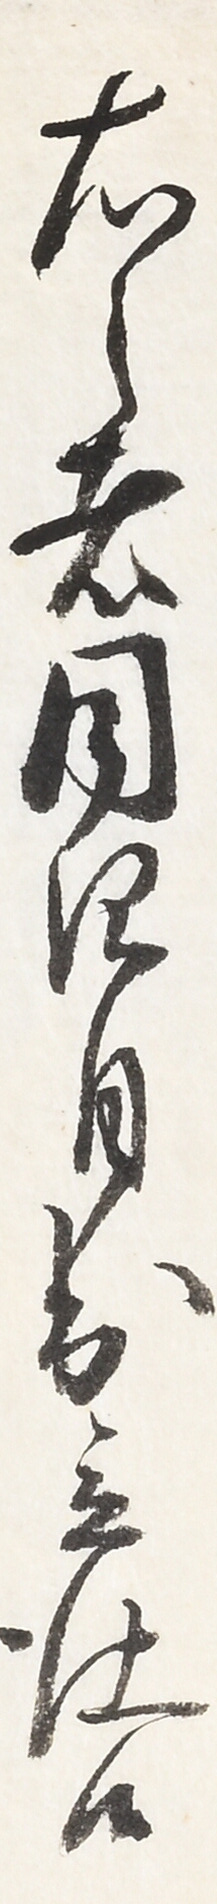右之者同四日出立仕候
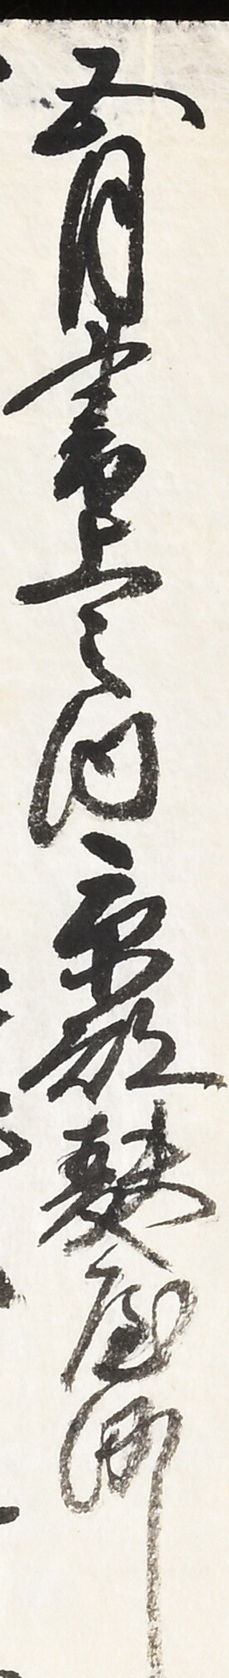五月書上之内京都麩屋町
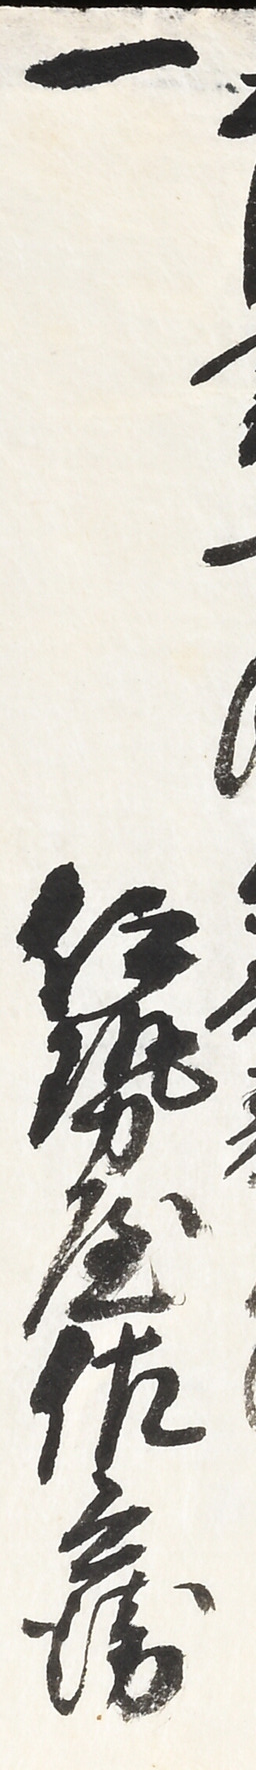一伊勢屋佐兵衛
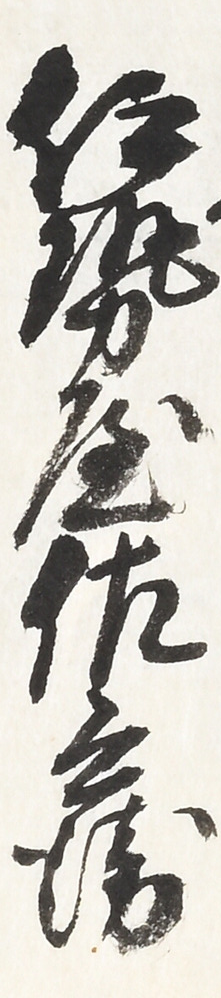一伊勢屋佐兵衛
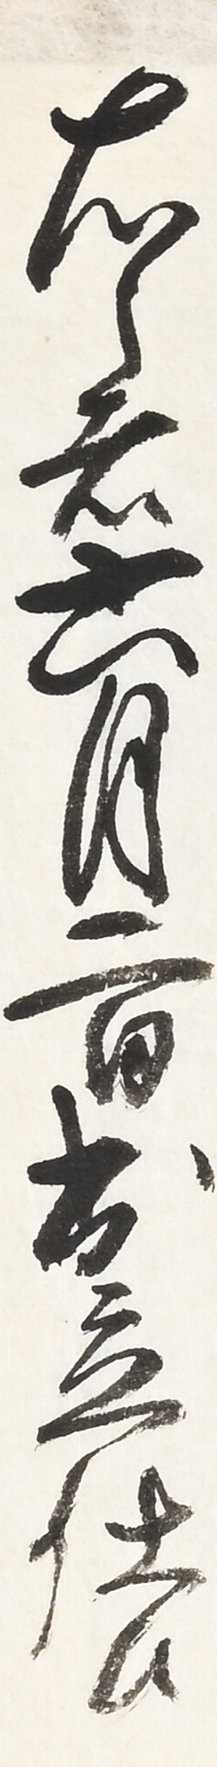右之者六月二日出立仕候
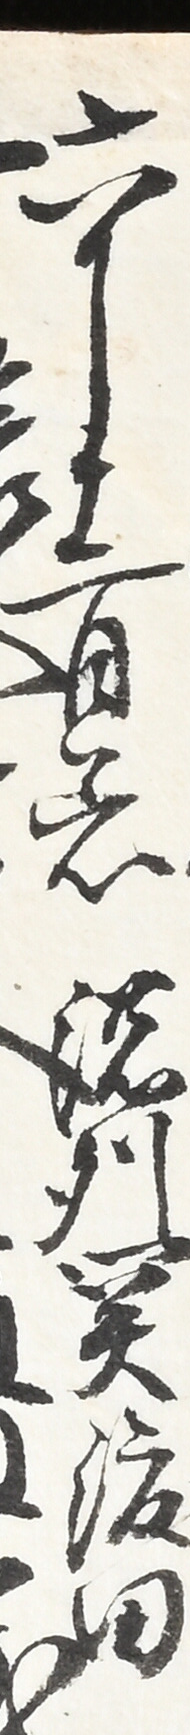六月十二日着濃州関渡田
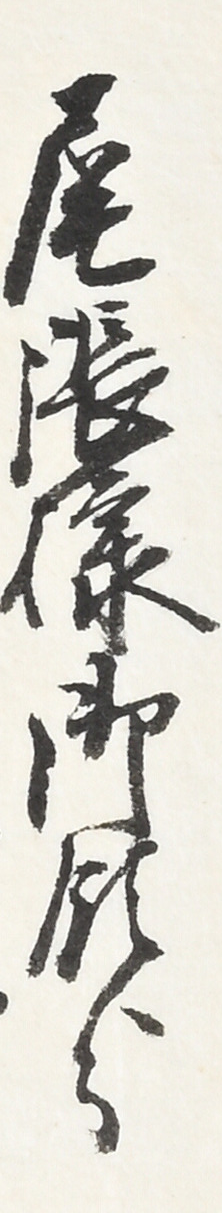尾張様御領分
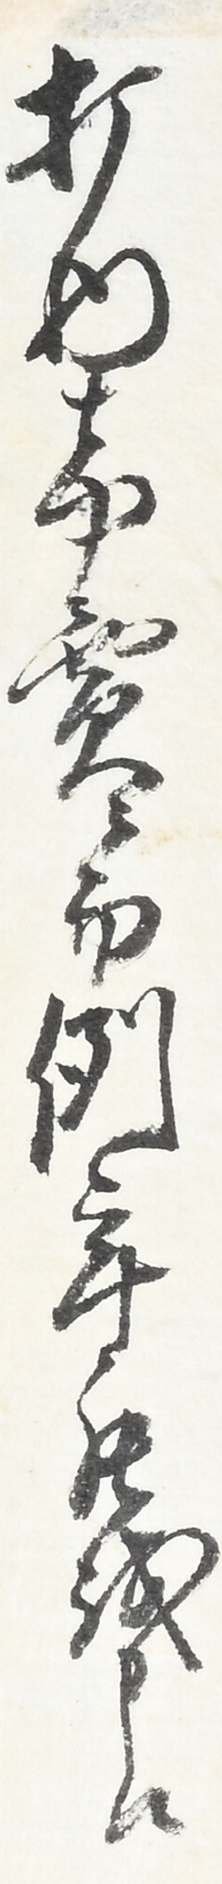打物商売ニ而例年罷越申候
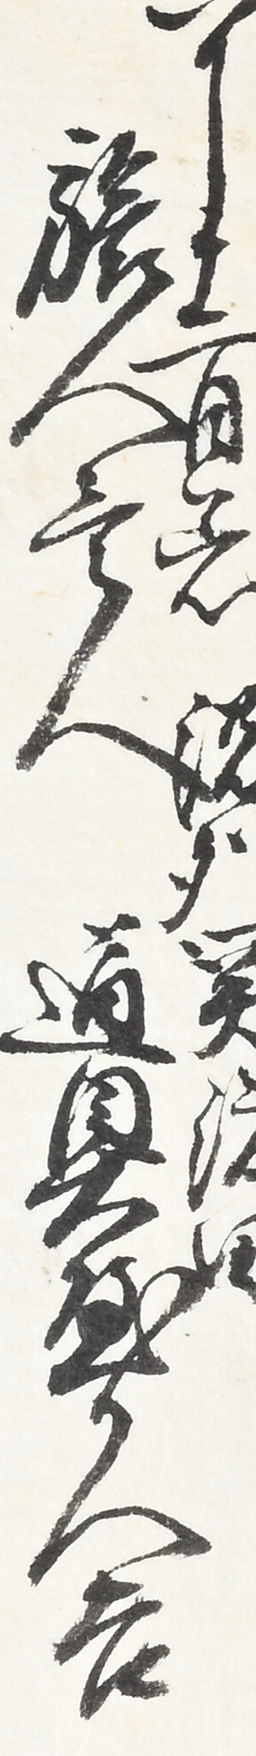一旅人壱人道具屋久吉
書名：旅人泊控帳
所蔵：伊那市立高遠町図書館・合同会社AMANE
